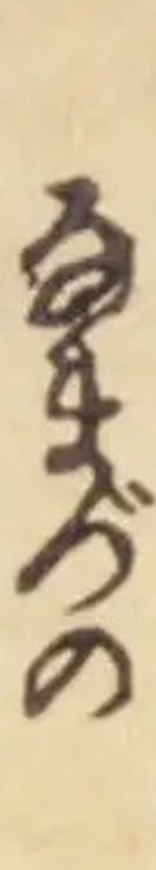なまづの
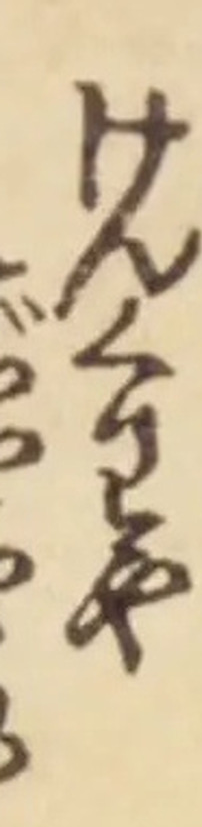けんくわや
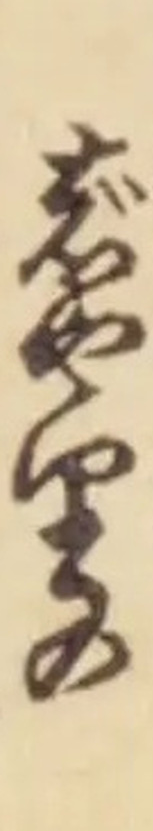じやりの
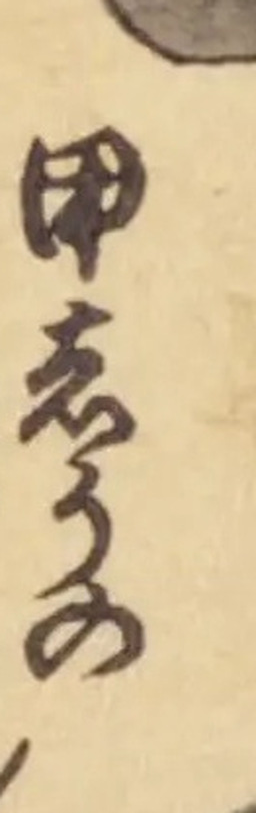甲しうの
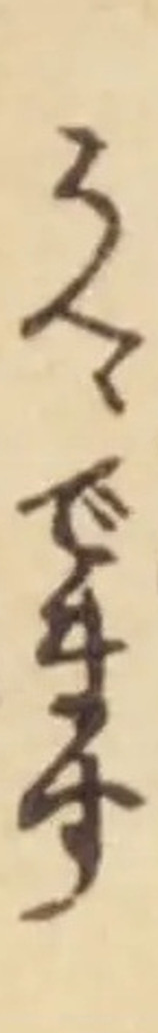うへゝでます
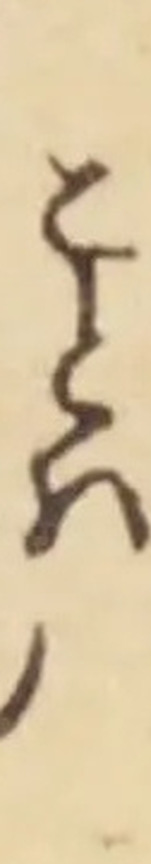ことは
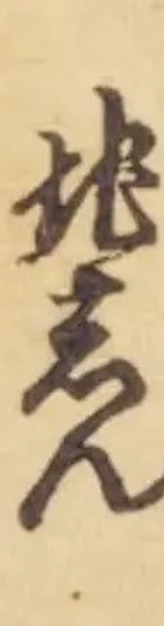地しん
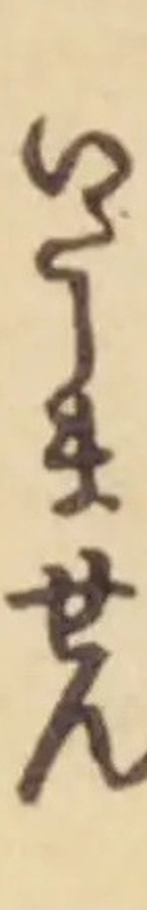いたしません
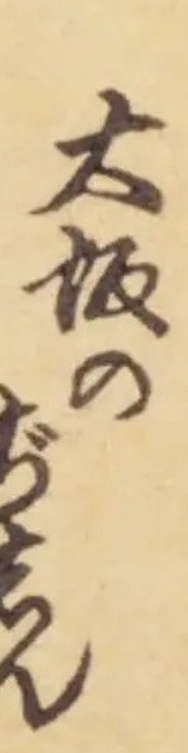信州のぢしん
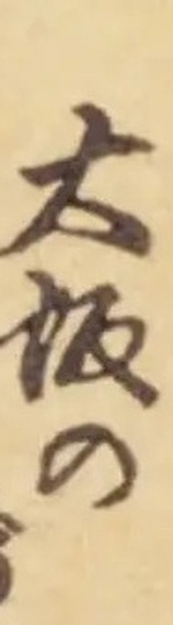大坂の
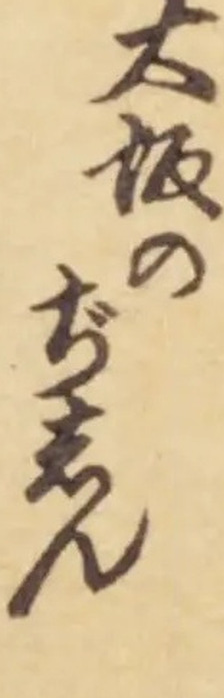ぢしん
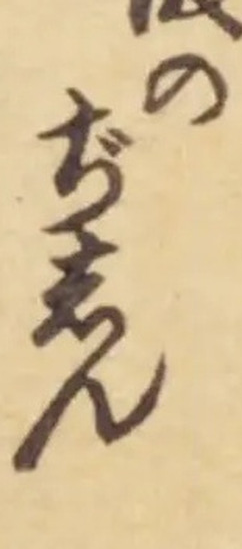ぢしん
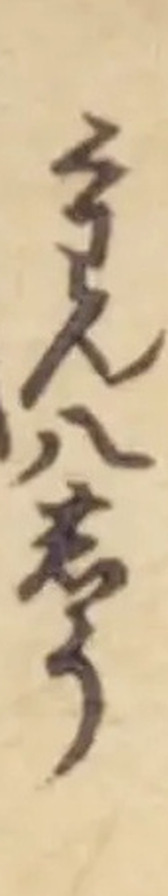くわん八しう
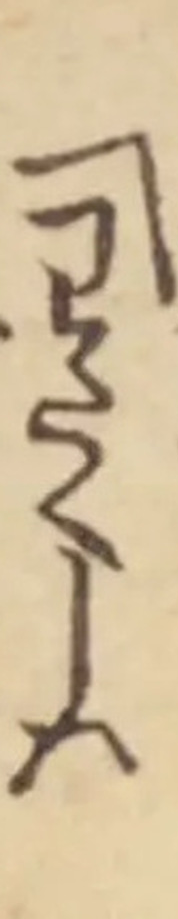「わたくしは
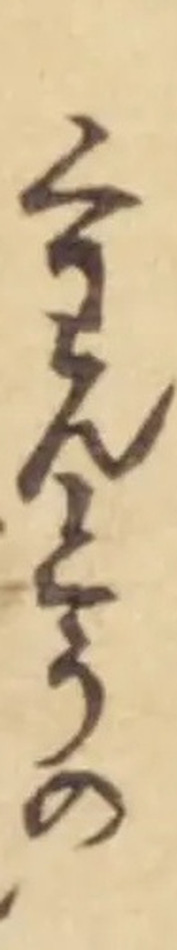くわんとうの
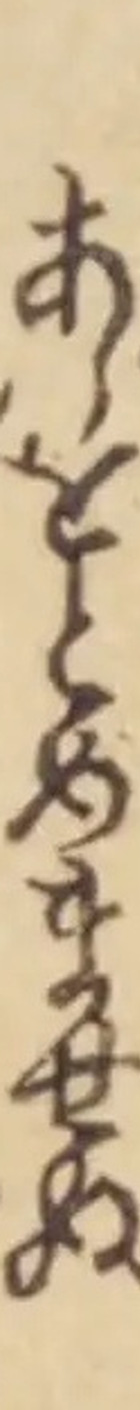あしをとめませぬ
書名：（地震鯰の取調べ）
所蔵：国立国会図書館 National Diet Library, JAPAN
